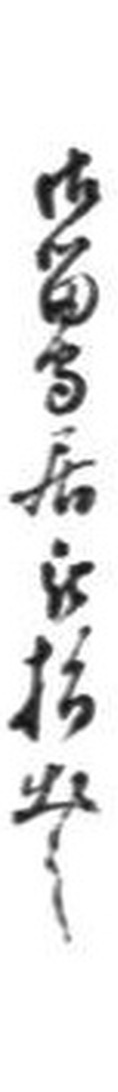御留守居被指出之
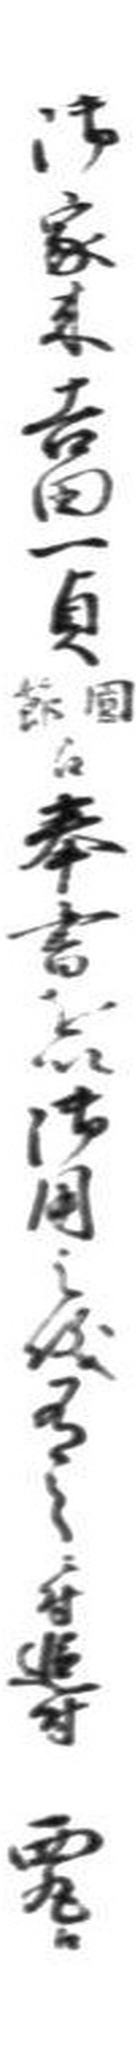御家来吉田一貞円節江奉書を以御用之儀有之ニ付追付西丸江
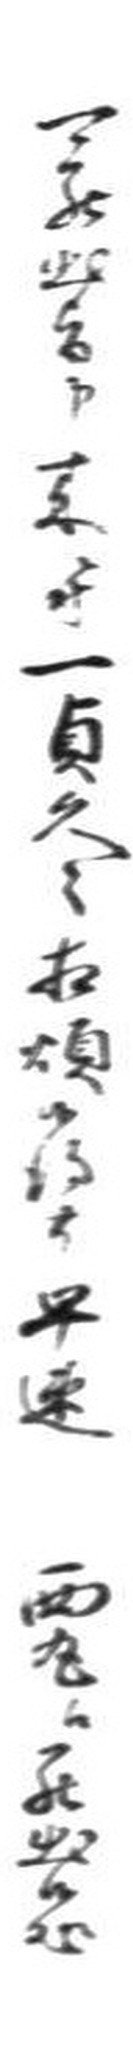可罷出旨申来ニ付一貞久々相煩候得共早速西丸江罷出候処
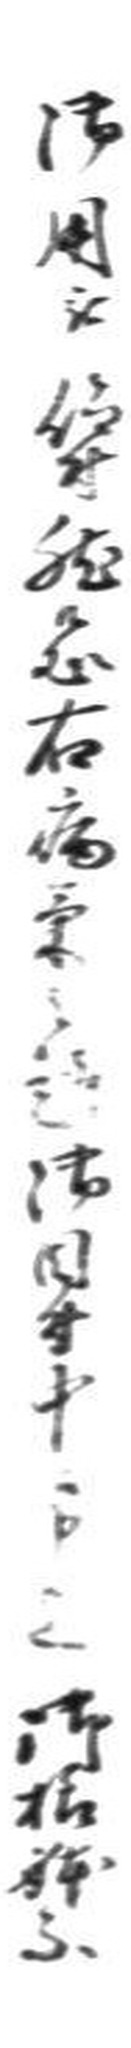御用被仰付然ル処右病気之趣御目付中江申上御様躰不
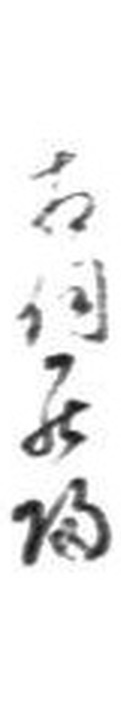相伺罷帰
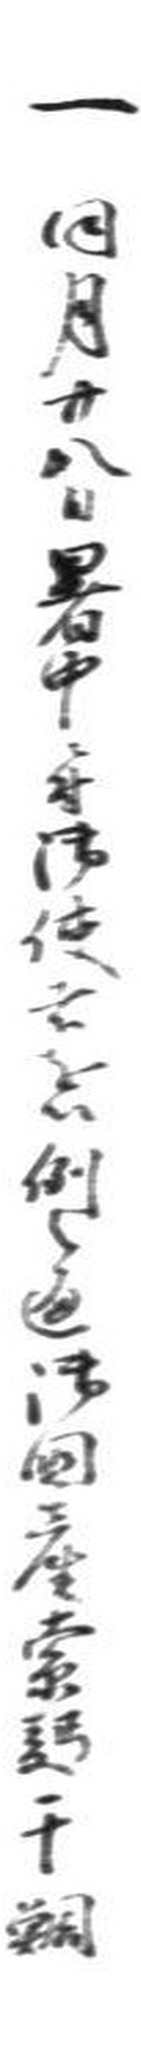一同月廿八日暑中ニ付御使者を以例之通御国産索麪干鯛
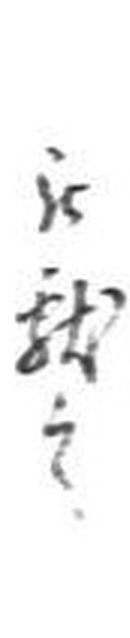被献之
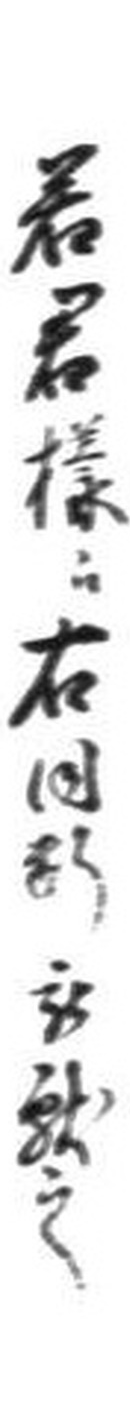若君様江右同断被献之

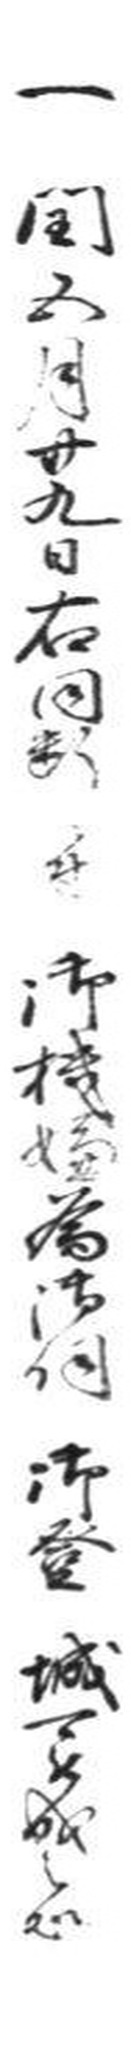一閏五月廿九日右同断ニ付御機嫌為御伺御登城可被成之処
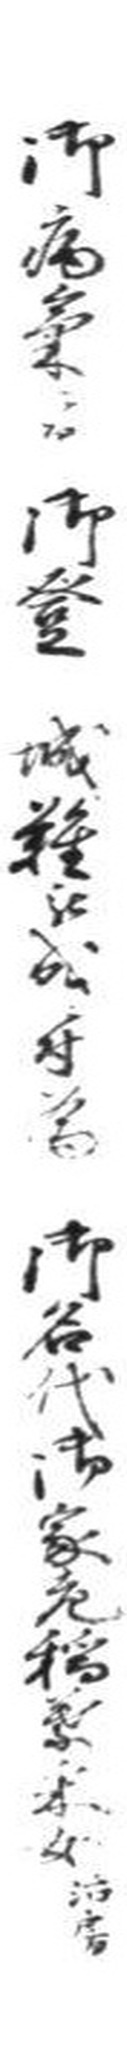御病気ニ而御登城難被成ニ付為御名代御家老稲葉采女治房
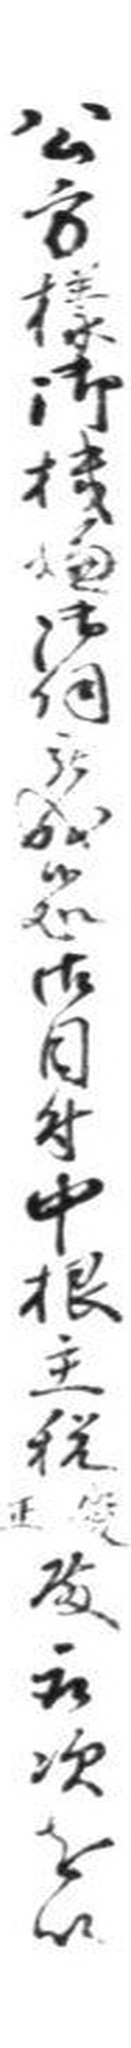公方様御機嫌御伺被成候処御目付中根主税慶正殿取次を以
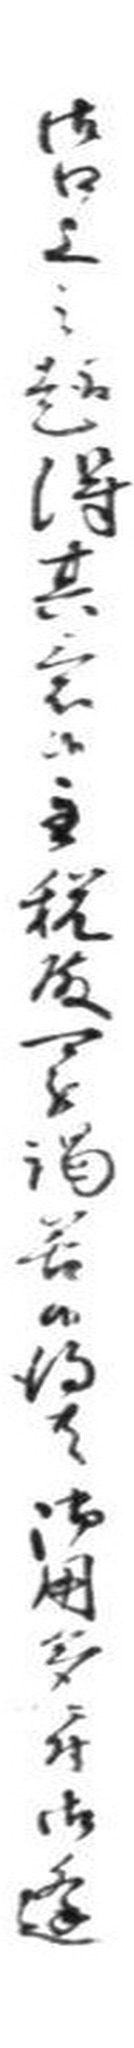御口上之趣得其意候主税殿可被謁筈候得共御用多ニ付御逢
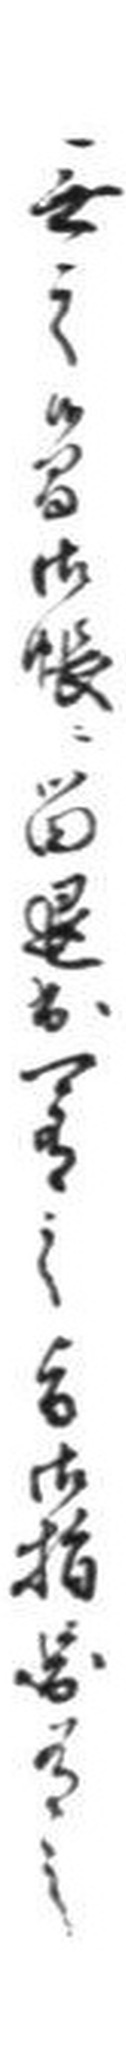無之候間御帳ニ留退出可有之旨御指図有之
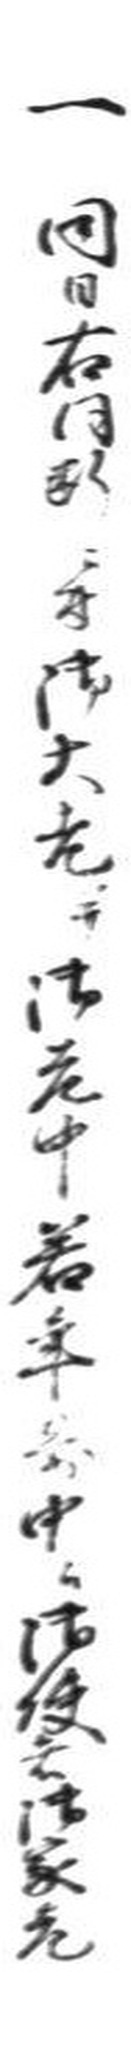一同日右同断ニ付御大老并御老中若年寄中江御使者御家老
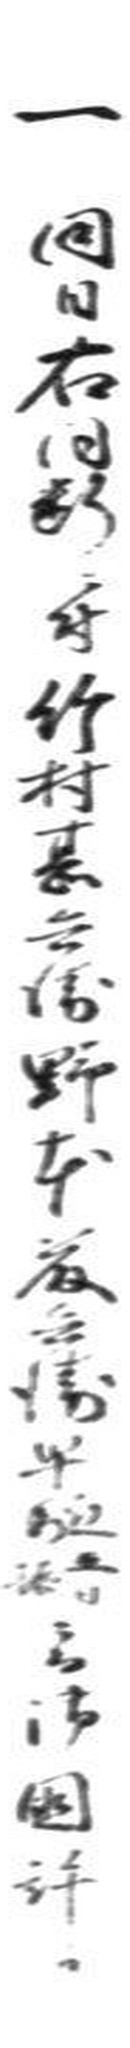一同日右同断ニ付武村甚兵衛野本藤兵衛早駆五日振ニ而御国許江
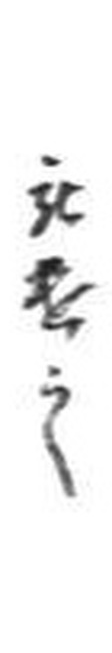被遣之
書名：家譜 十五 綱昌公 従天和元年到元禄十二年
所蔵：福井県文書館 Fukui Prefectural Archives
